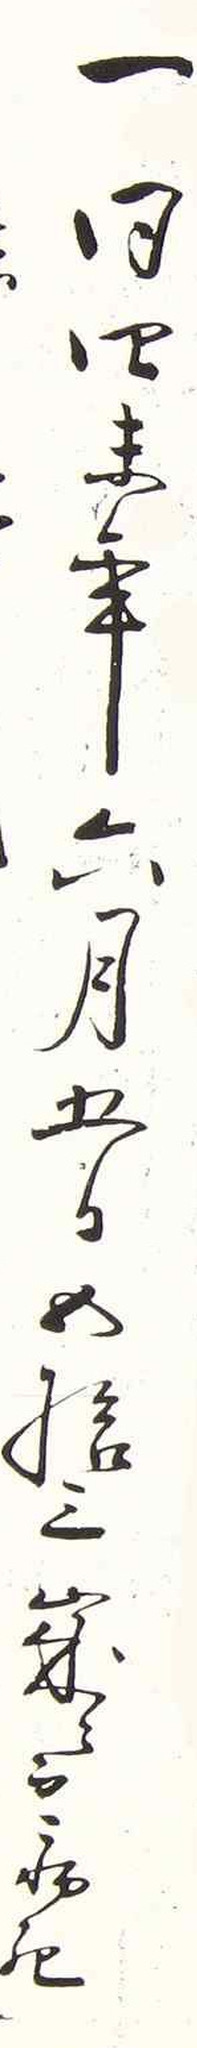一同四未年六月五日五拾三歳ニ而病死
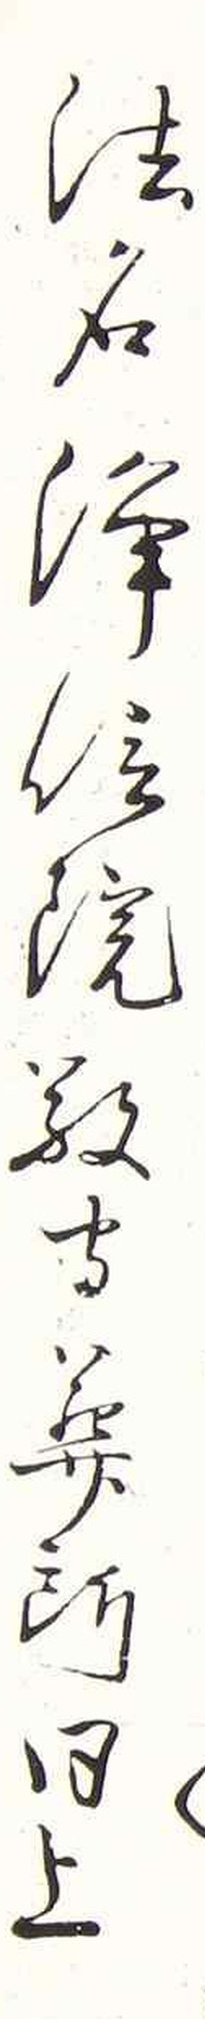法名浄信院敬守葬所同上
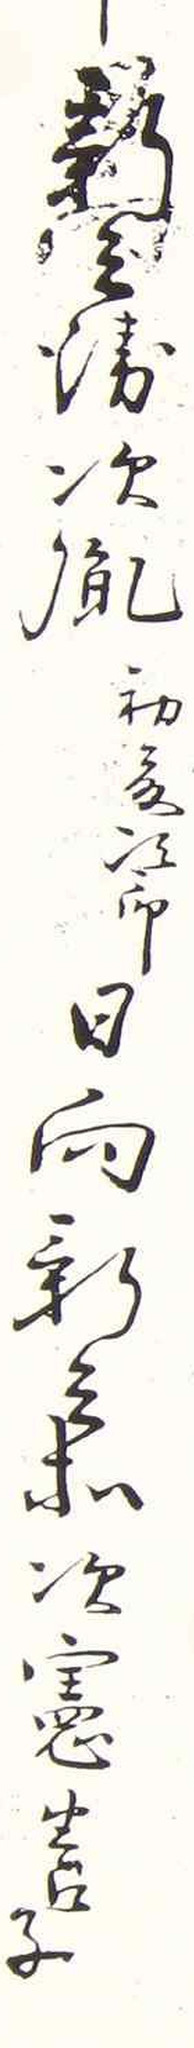新兵衛次胤初藤次郎日向新兵衛次憲養子

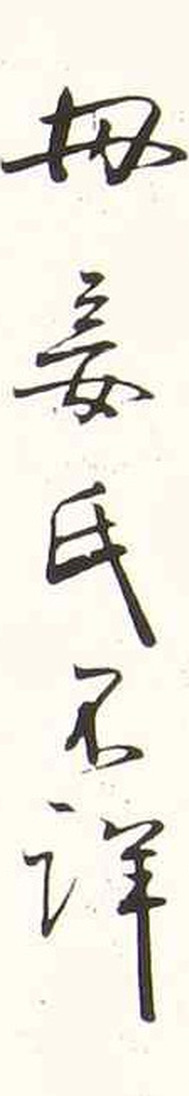母妾氏不詳
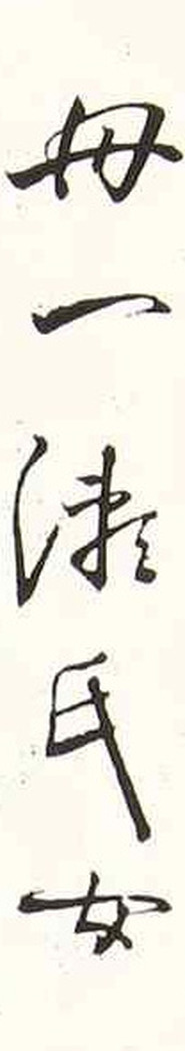母一瀬氏女
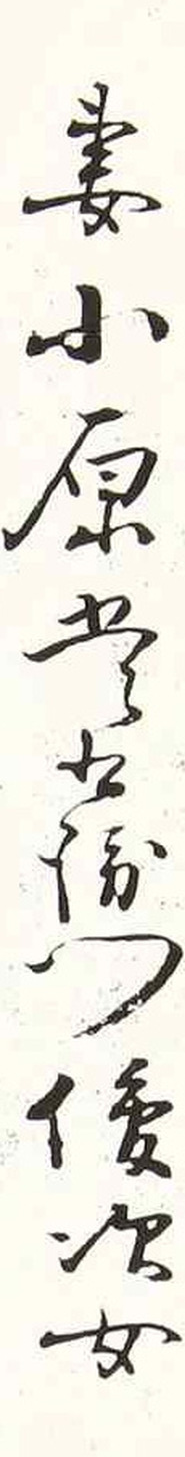妻小原五郎左衛門俊次女
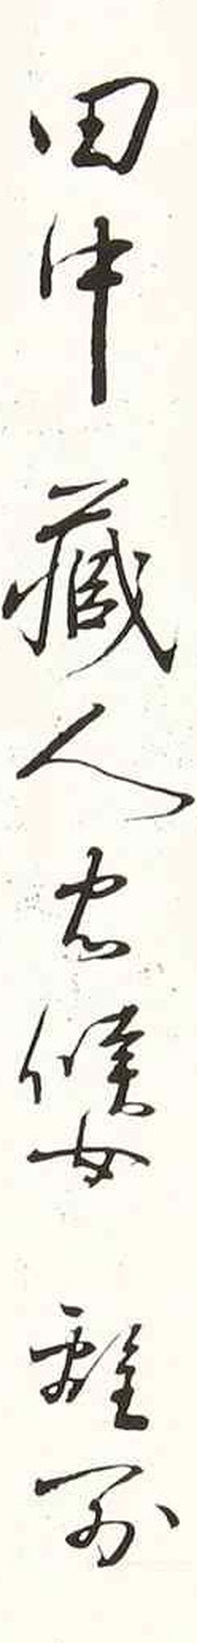田中蔵人忠候女離別
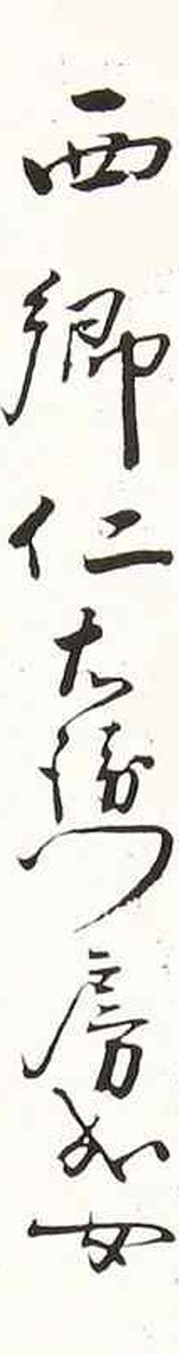西郷仁右衛門房成女
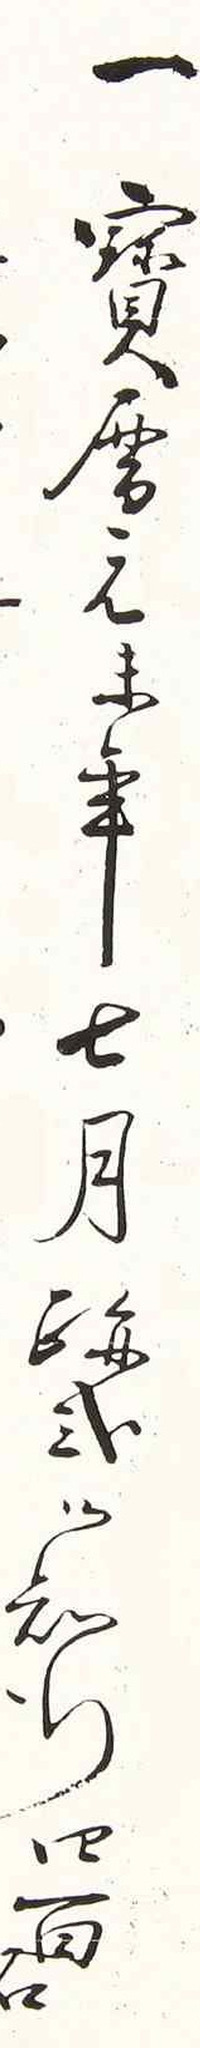一宝暦元未年七月跡式御知行四百石
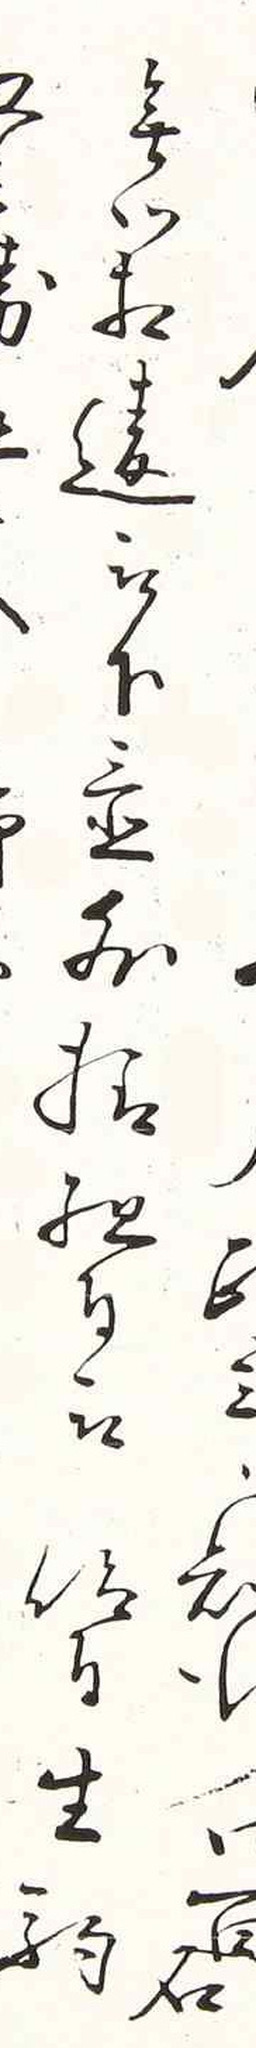無御相違被下置外様組付被仰付生駒
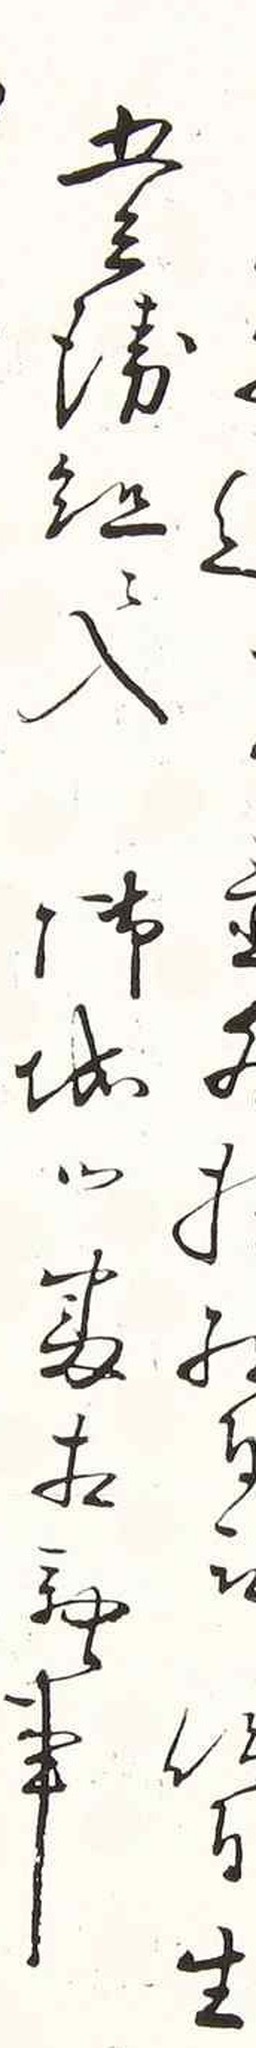五兵衛組ニ入御城御番相勤候事
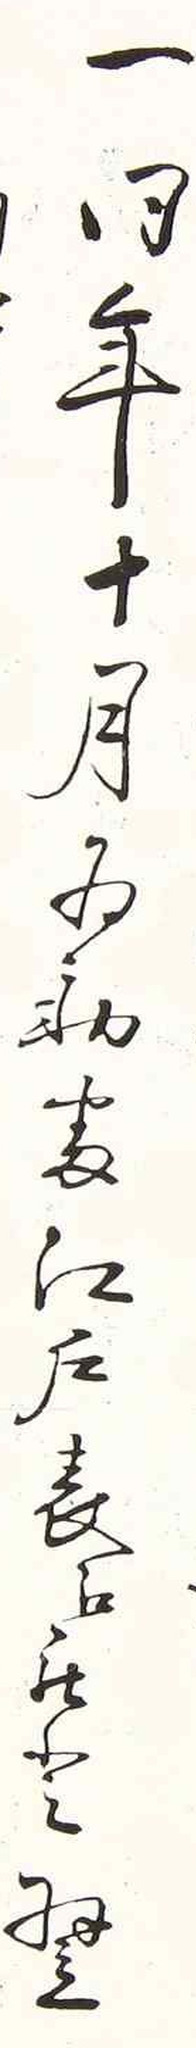一同年十月為勤番江戸表江罷登翌
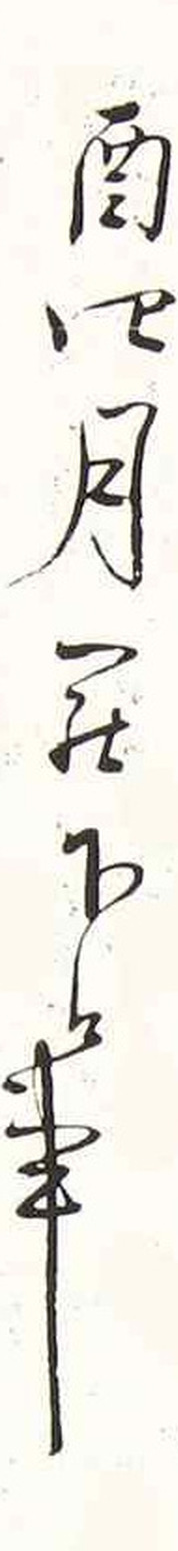酉四月罷下候事
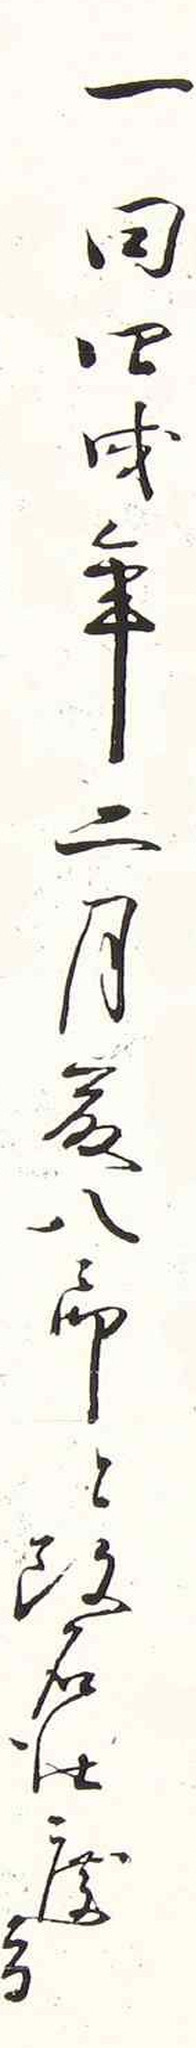一同四戌年二月藤八郎と改名仕度旨
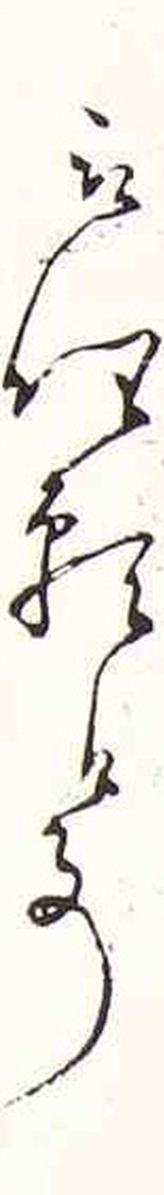被任願候事
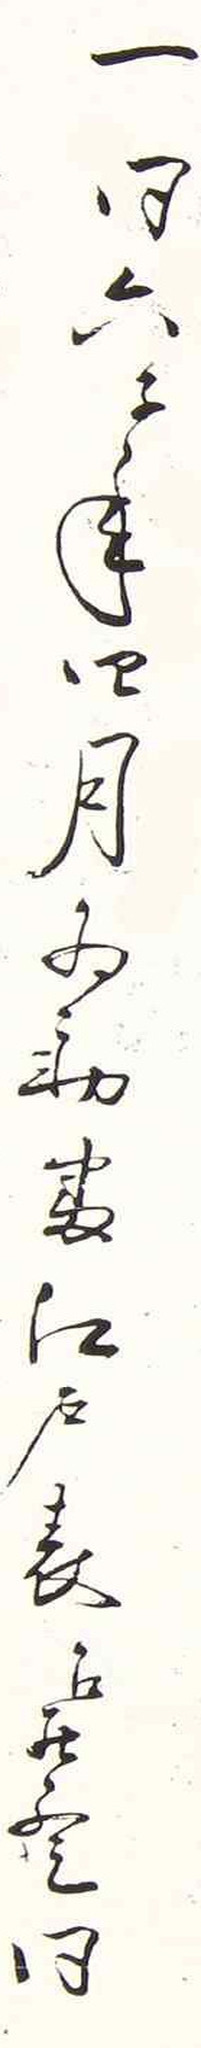一同六子年四月為勤番江戸表江罷登同
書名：諸士系譜　巻之357　す之部7
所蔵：会津若松市立会津図書館
